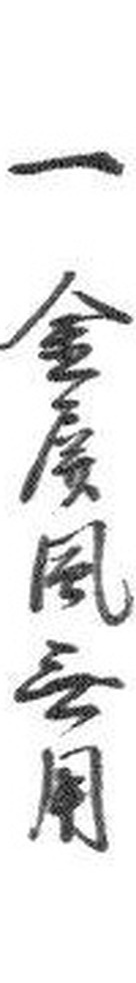一金屛風無用
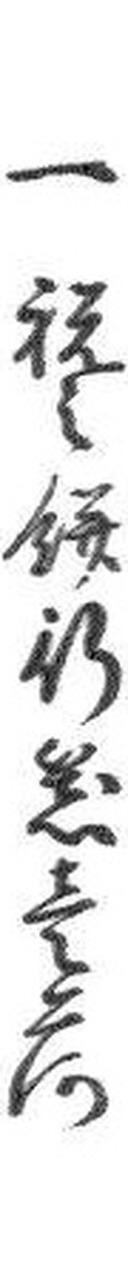一祝之餅行器壱荷
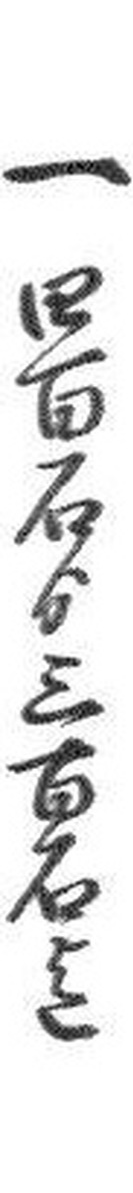一四百石ゟ三百石迄
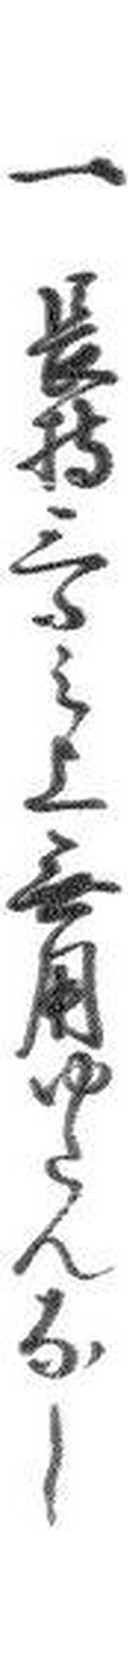一長持三ツ之上無用ゆたんなし
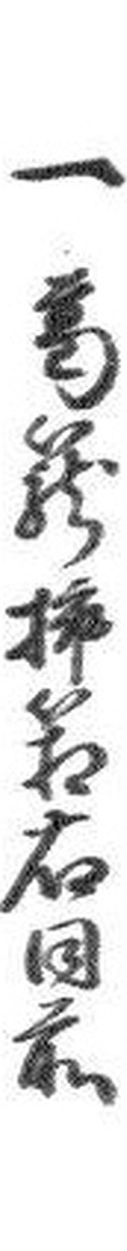一葛籠挿箱右同前
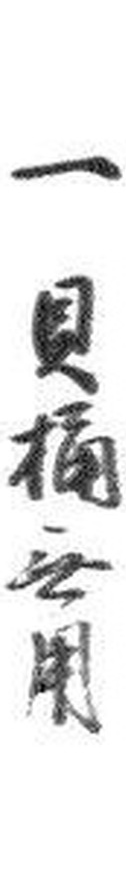一貝桶無用
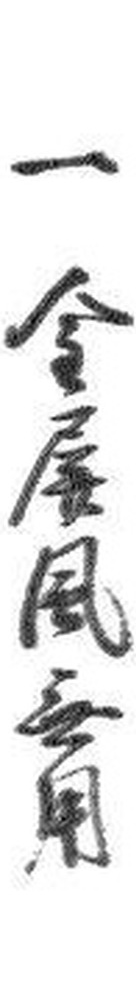一金屛風無用
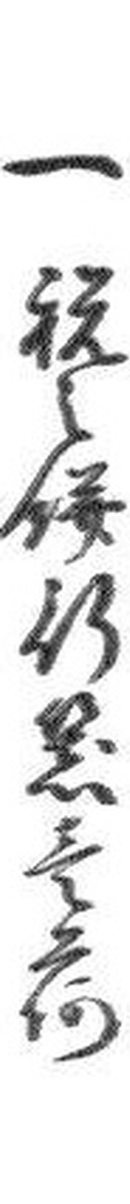一祝之餅行器壱荷

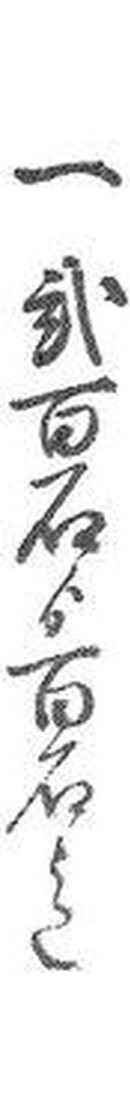一弐百石ゟ百石迄
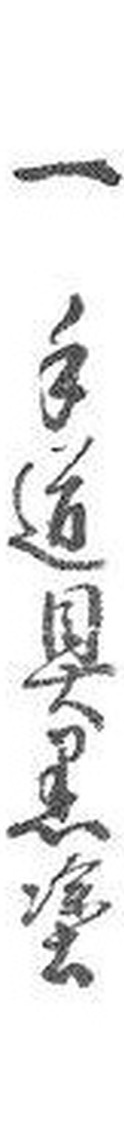一手道具黒塗
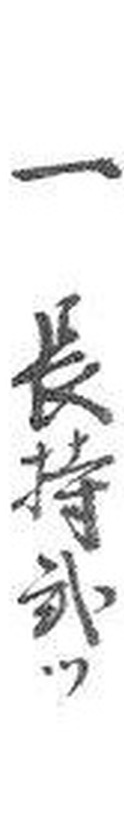一長持弐ツ
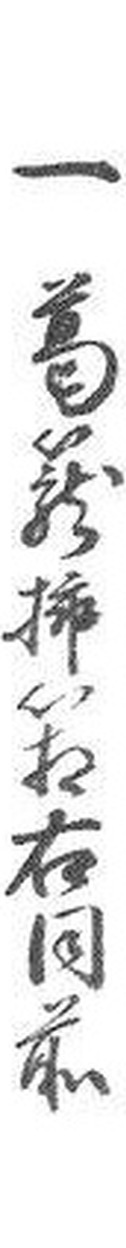一葛籠挿箱右同前
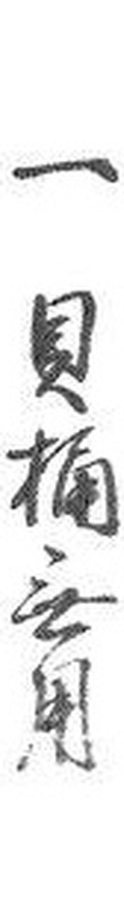一貝桶無用
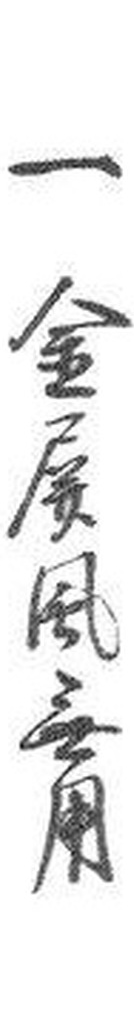一金屛風無用
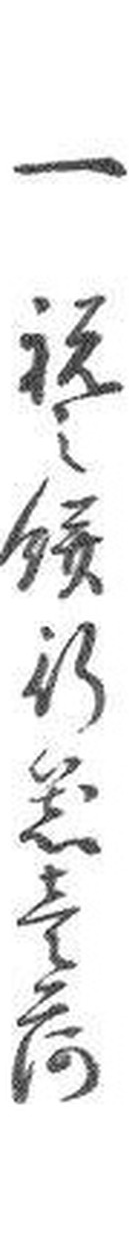一祝之餅行器壱荷
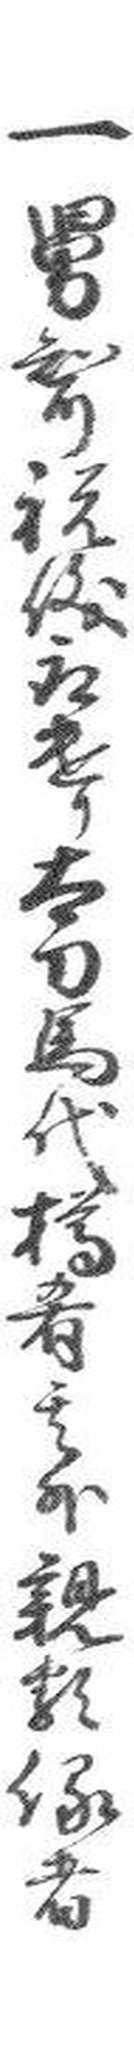一舅聟祝儀取遣り太刀馬代樽肴其外親類縁者
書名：家譜 六 光通公 従万治三年到寛文三年
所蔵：福井県文書館 Fukui Prefectural Archives
